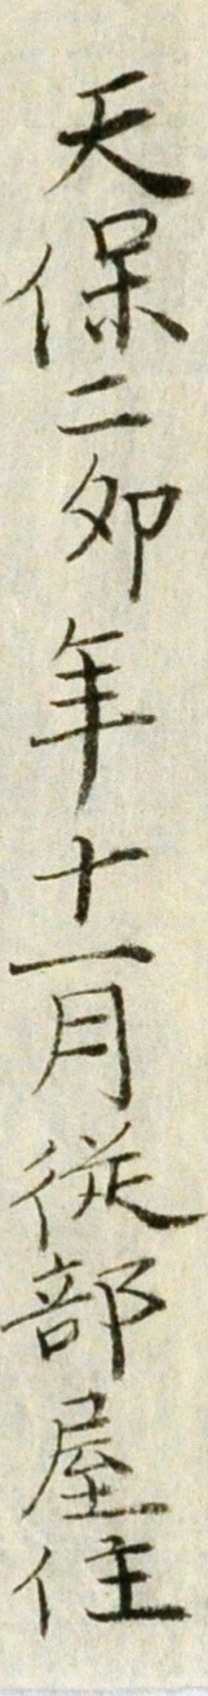天保二卯年十一月従部屋住
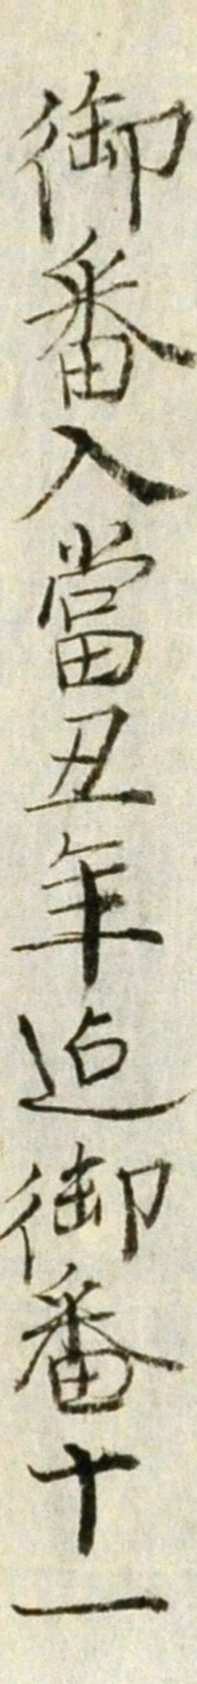御番入當丑年迄御番十一
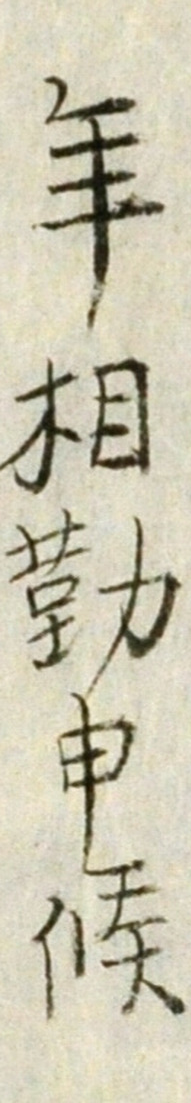年相勤申候
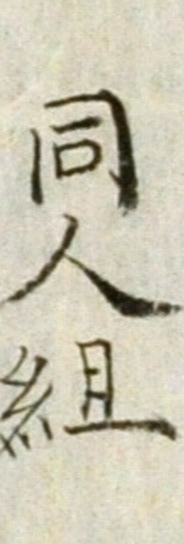同人組
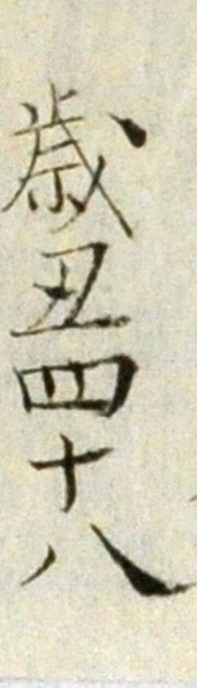歳丑四十八
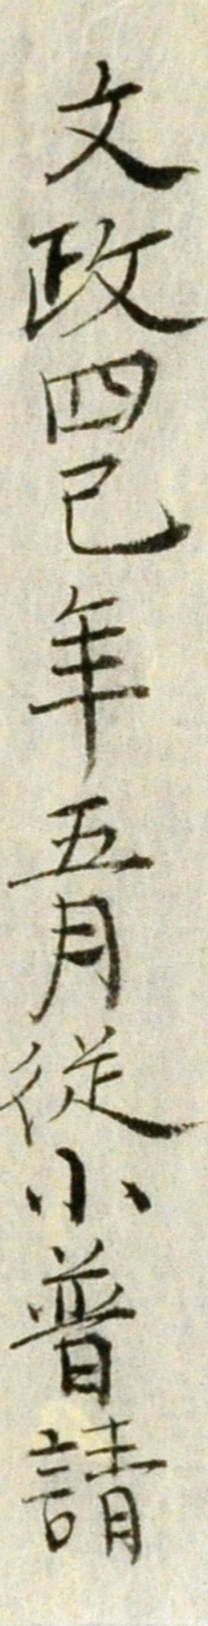文政四巳年五月従小普請
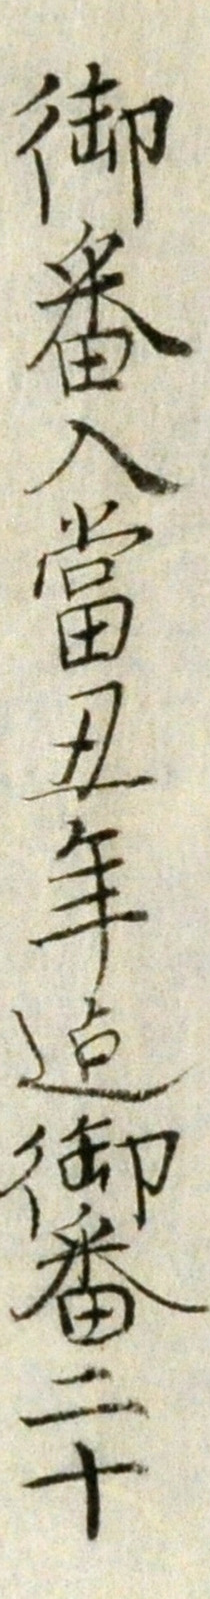御番入當丑年迄御番二十一
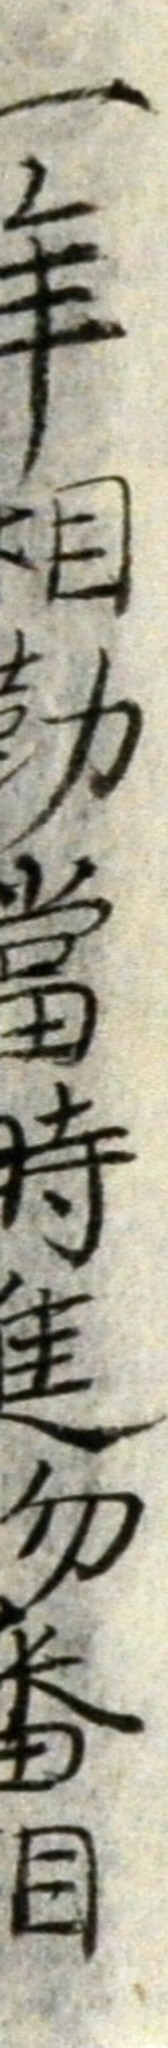一年相勤当時進物番相

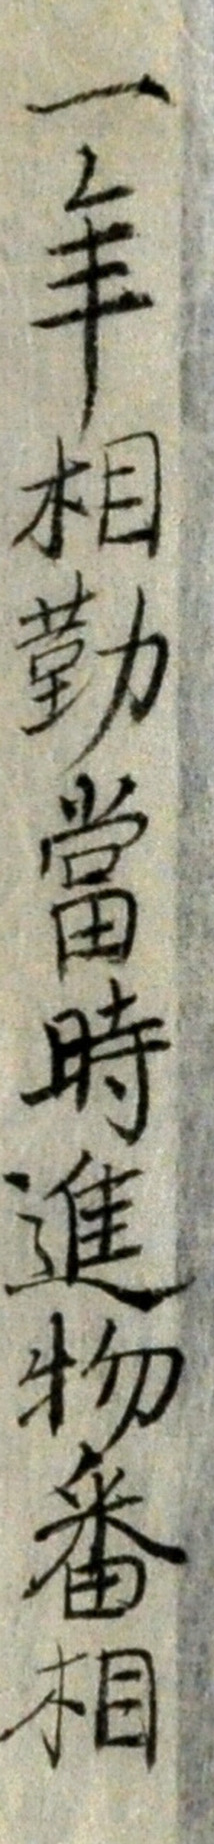一年相勤当時進物番相
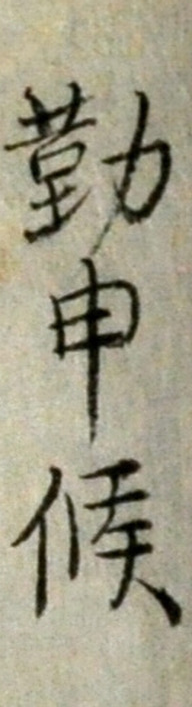勤申候
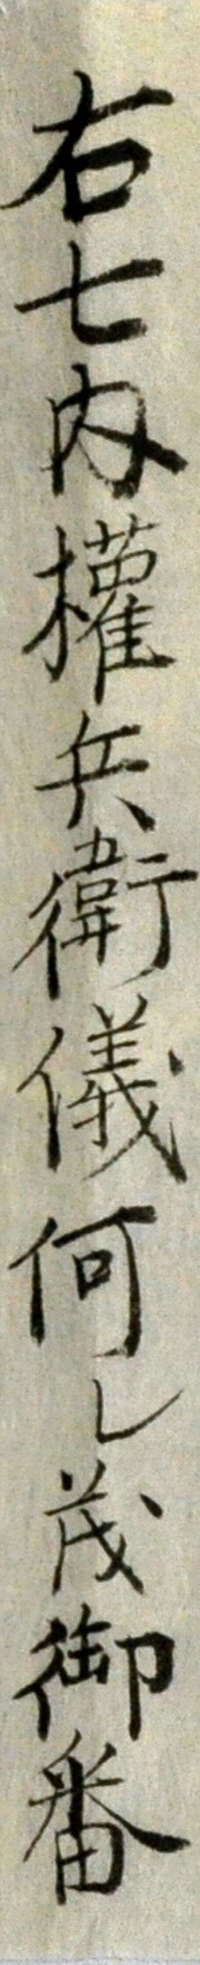右七内権兵衛儀何レ茂御番
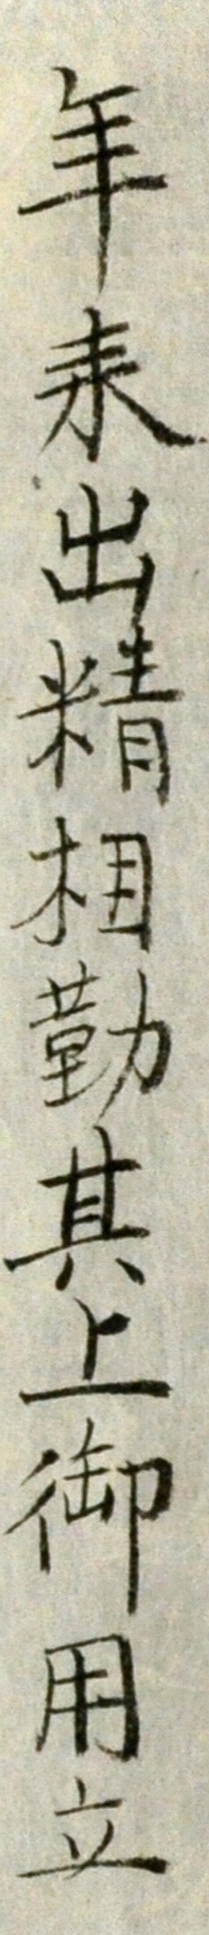年来出精相勤其上御用立
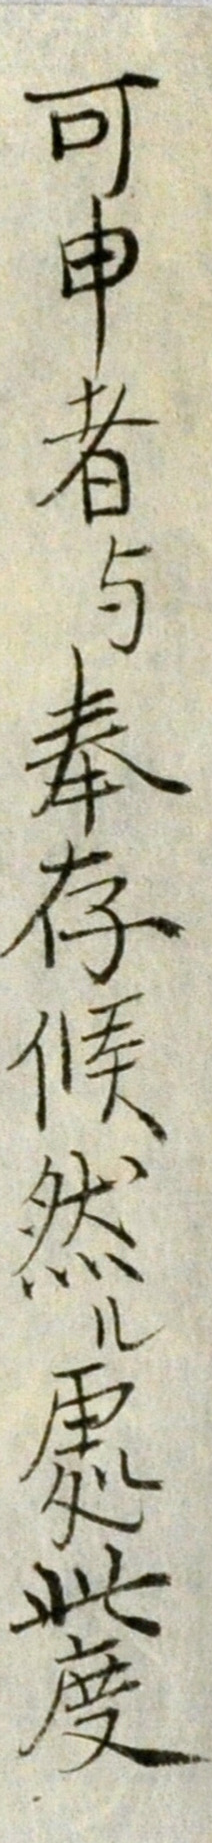可申者与奉存候然ル處此度
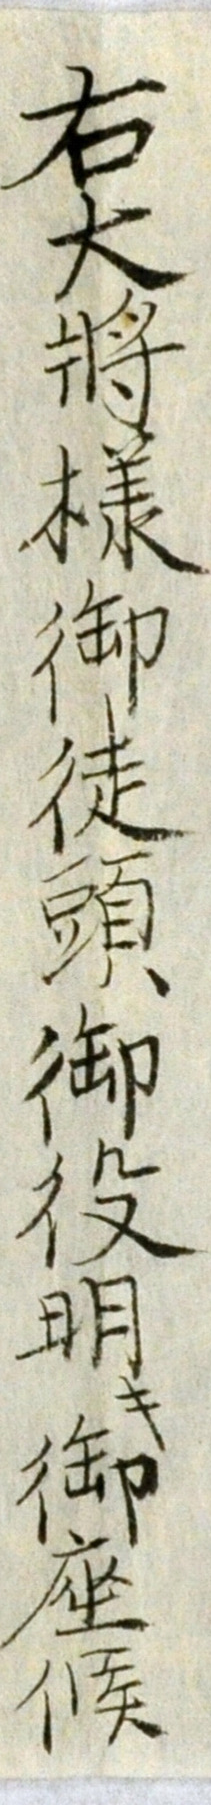右大将様御徒頭御役目明キ御座候
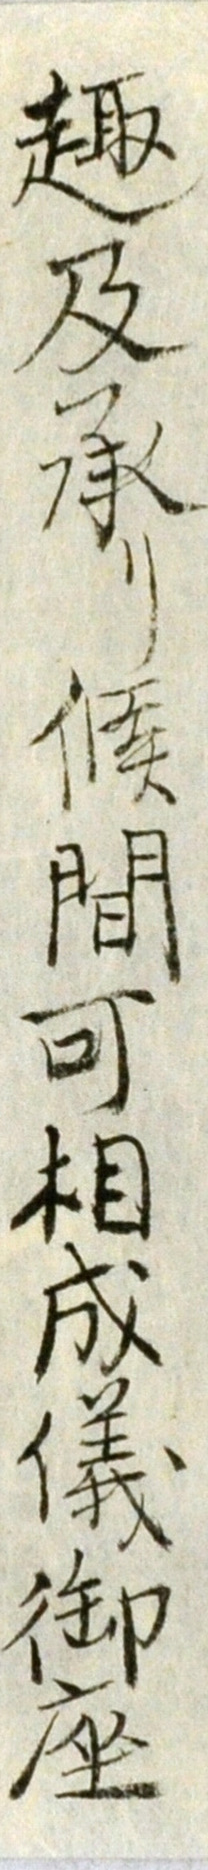趣及承リ候間可相成儀御座
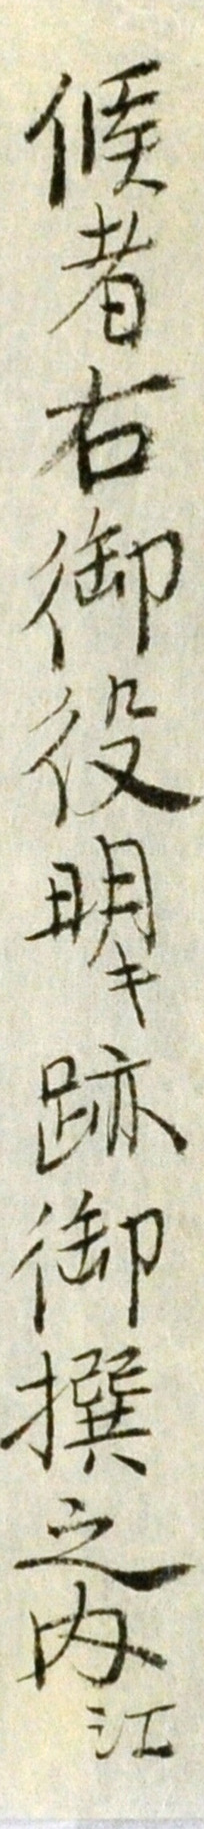候者右御役明キ跡御撰之内江
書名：若年寄御役中御調書付
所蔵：伊那市立高遠町図書館・合同会社AMANE
